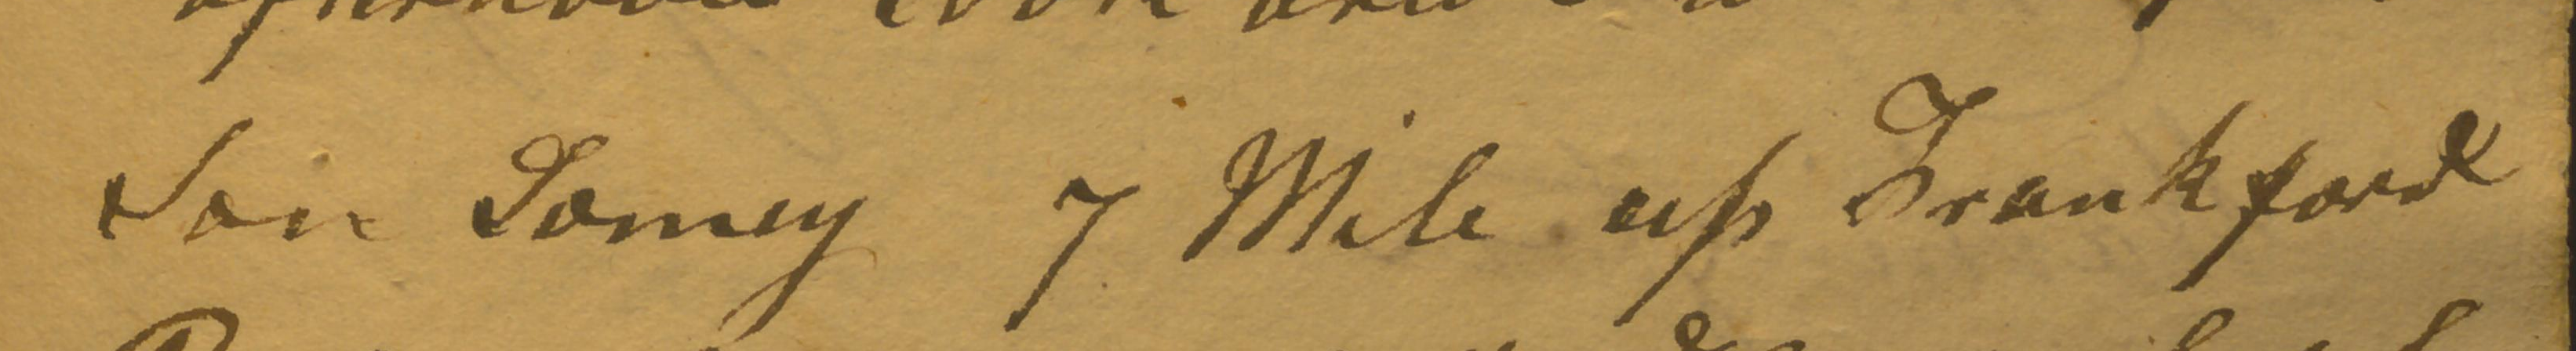Sane Tomey 7 Mile up Frankford
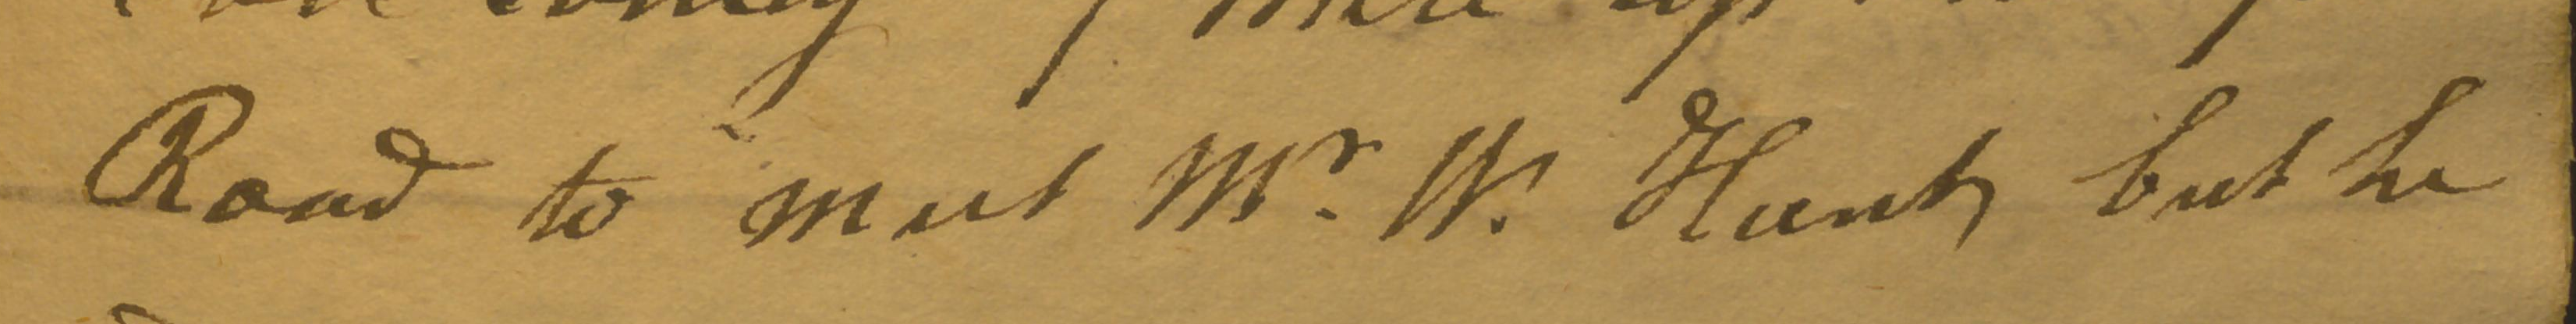Road to meet M^r. W. Hunt but he
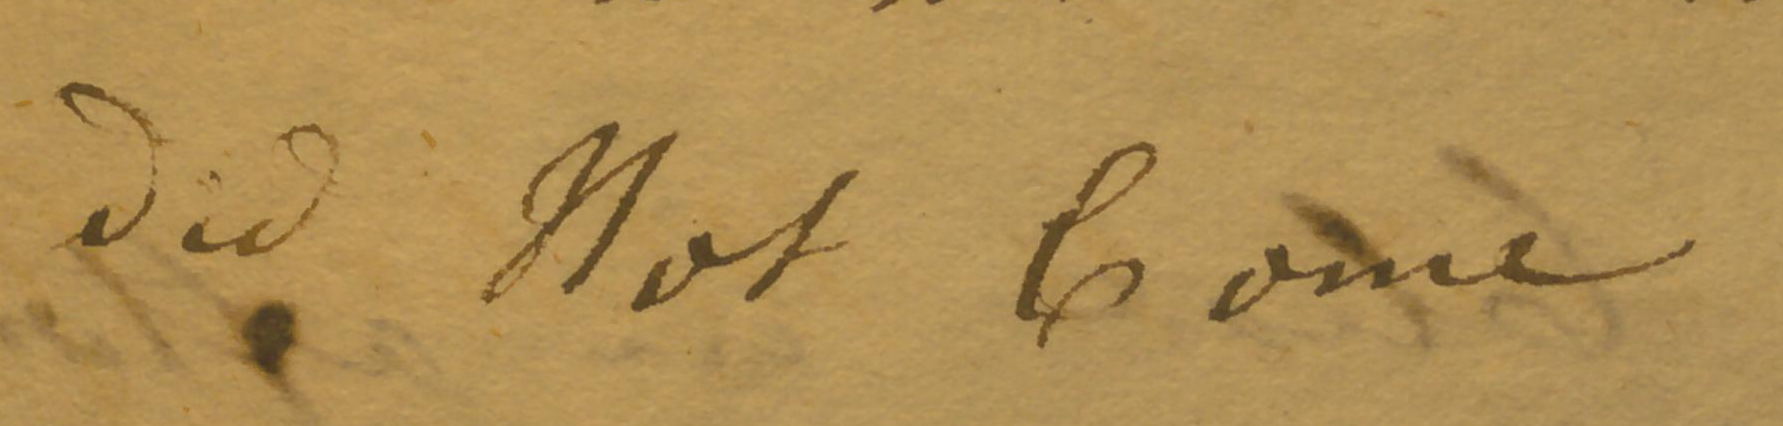did Not Come
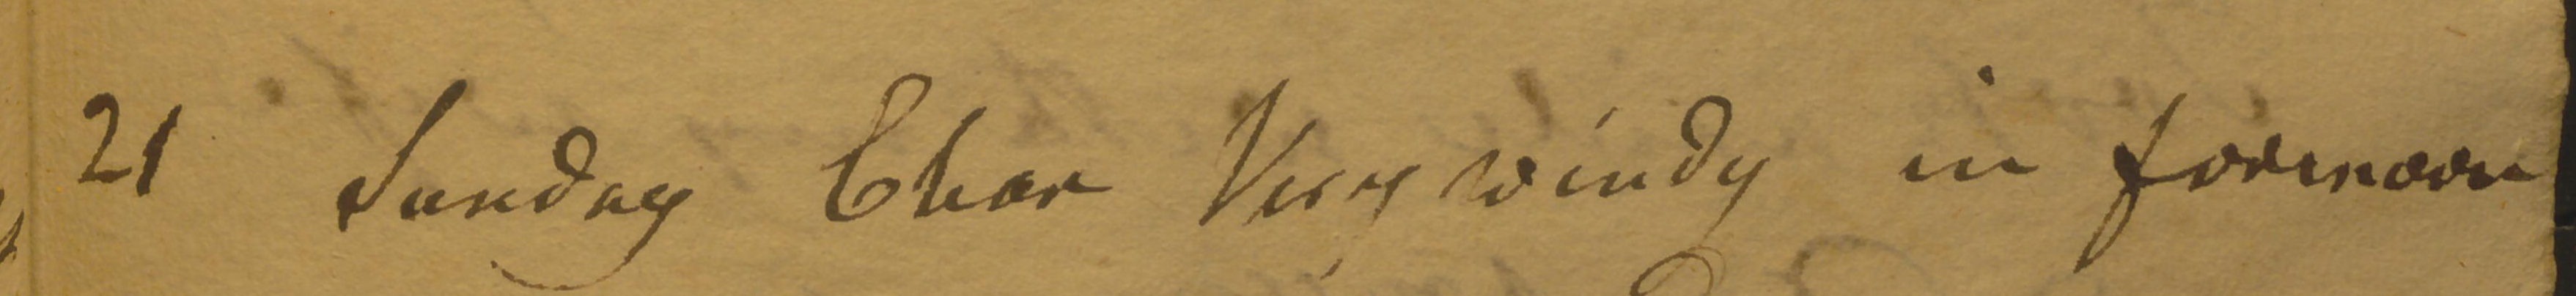21 Sunday Clear Very windy in forenoon
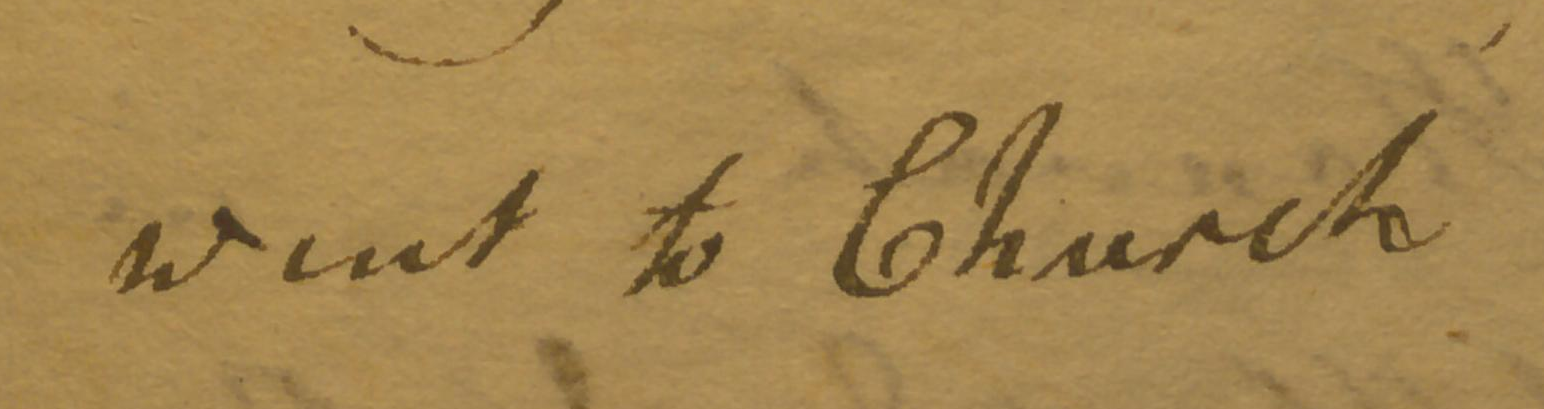went to Church
